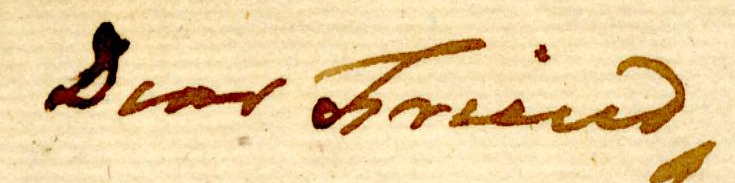Dear Friend
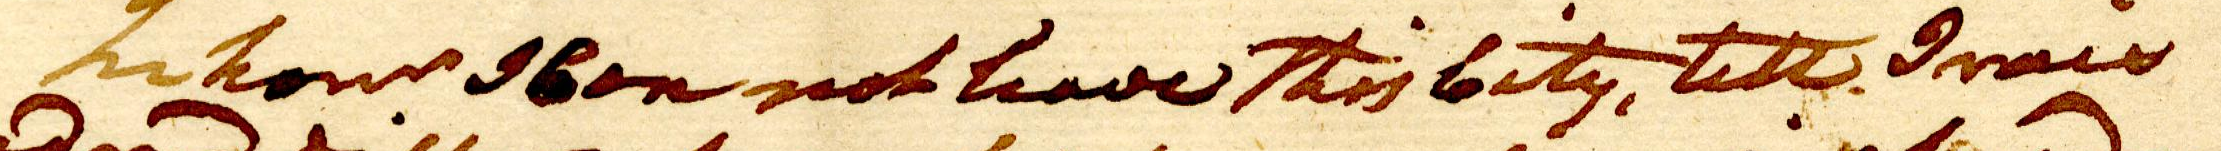In home I can not leave this city, till I rais
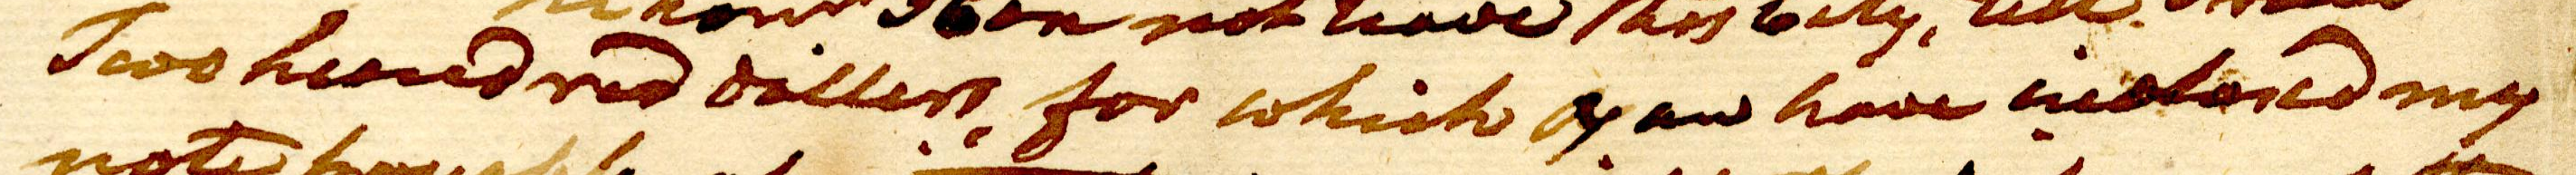Two hundred dollers, for which you have inclosed my
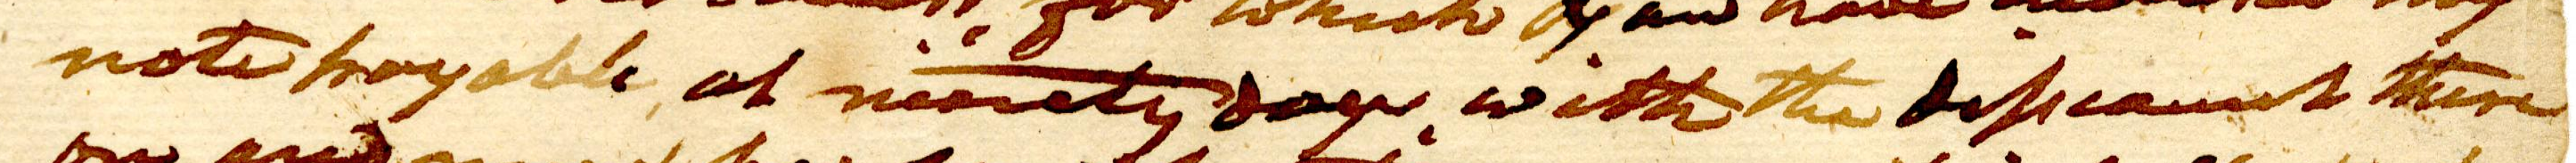note payable at ninety days, with the disscount there
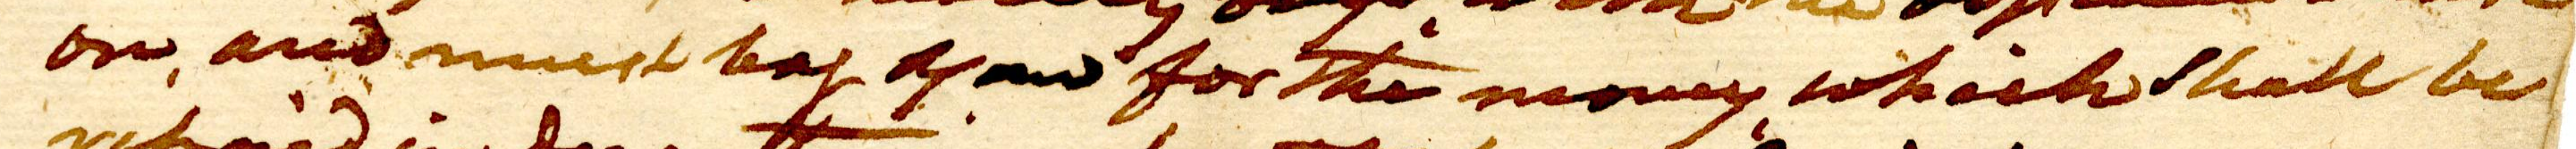on, and must beg you for the money which shall be
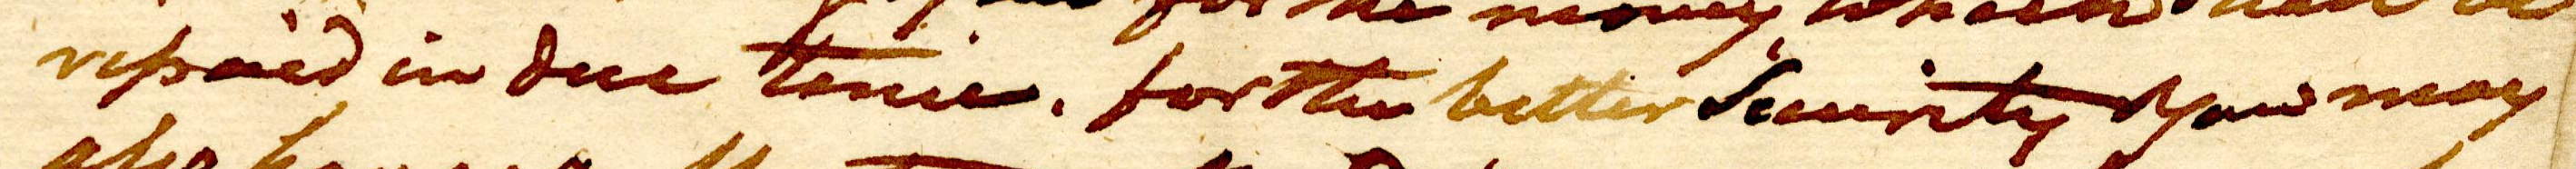repaid in due time. For the better security you may
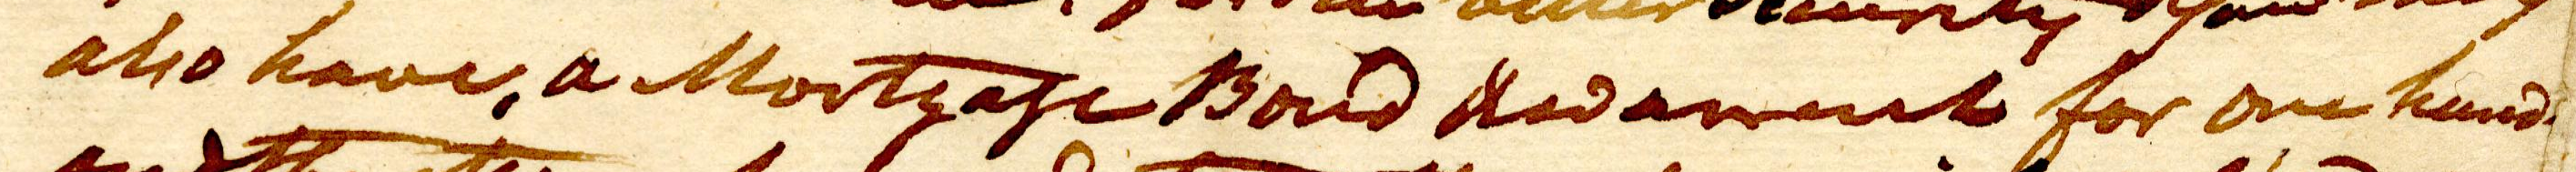also have, a Mortgage Bond now amount for one hund
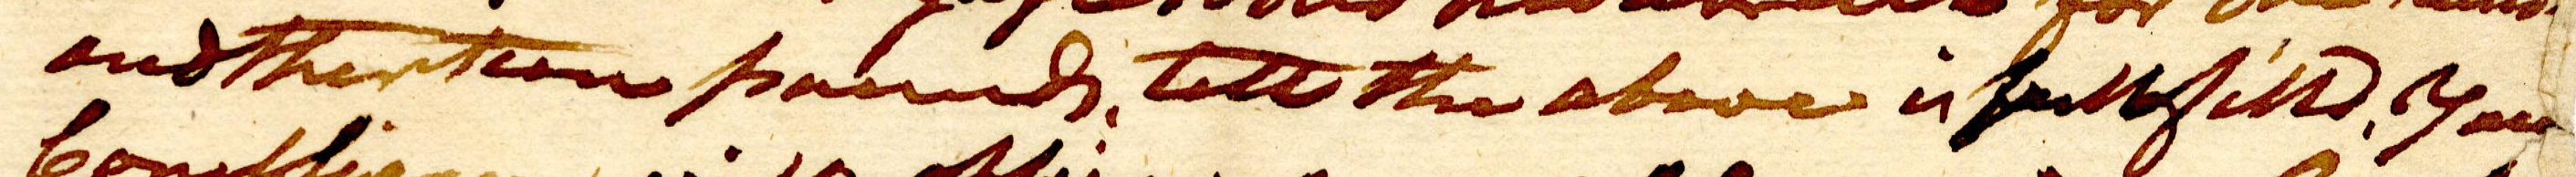and thirteen pounds; till the above, is satisfied you
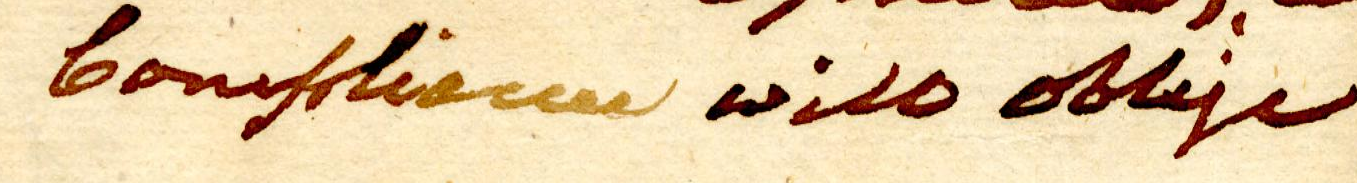compliance will oblige
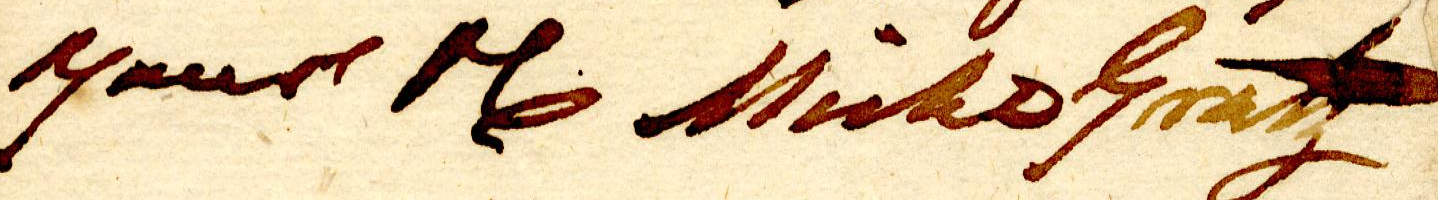yours &C Mich^l Gratz
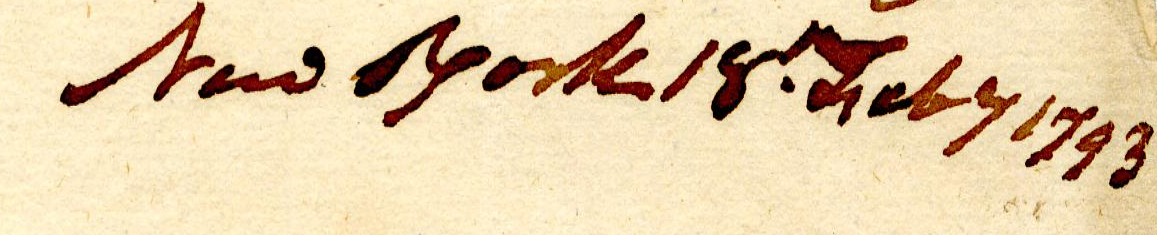New York 18^th Feb^y 1793
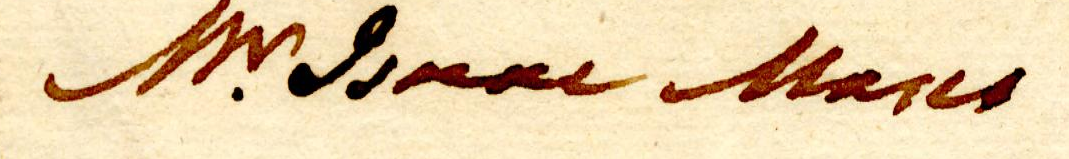M^r Isaac Moses
